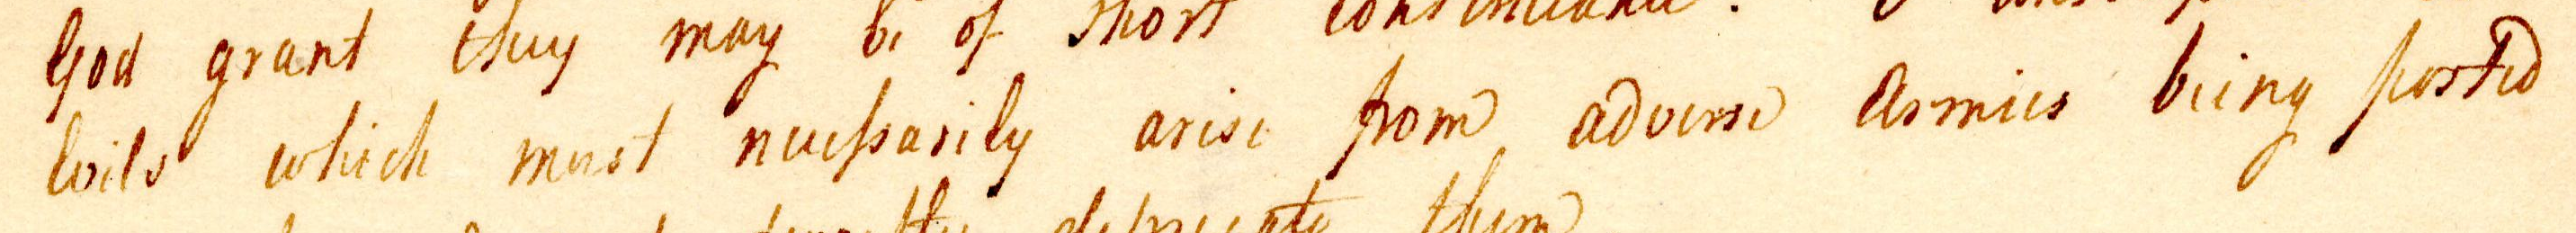Evils which must necessarily arise from adverse Armies being posted
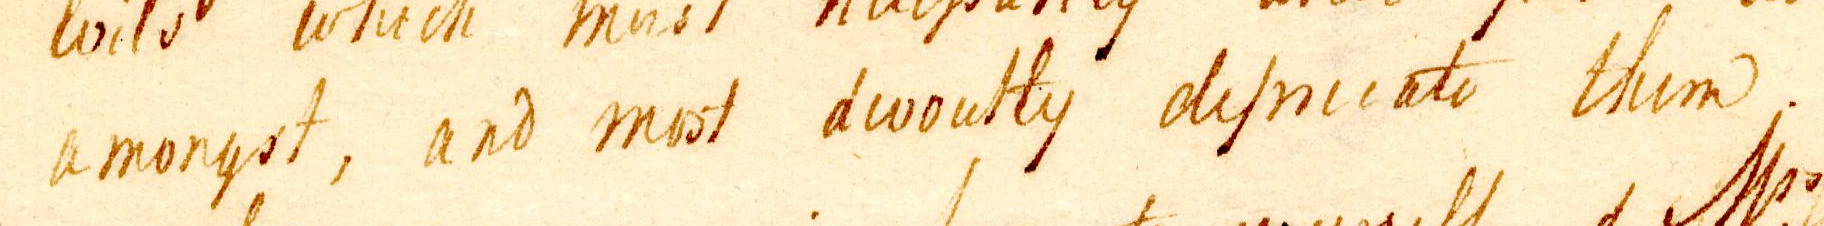amongst, and most devoutly deprecate them.
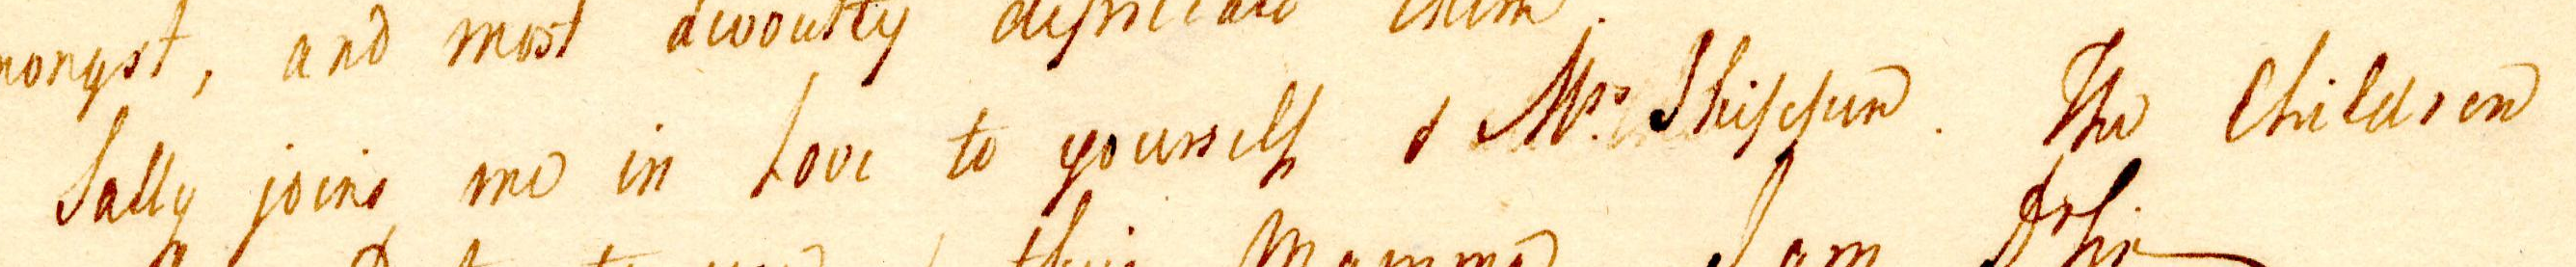Sally joins me in Love to yourself & M^rs. Shippen. The Children
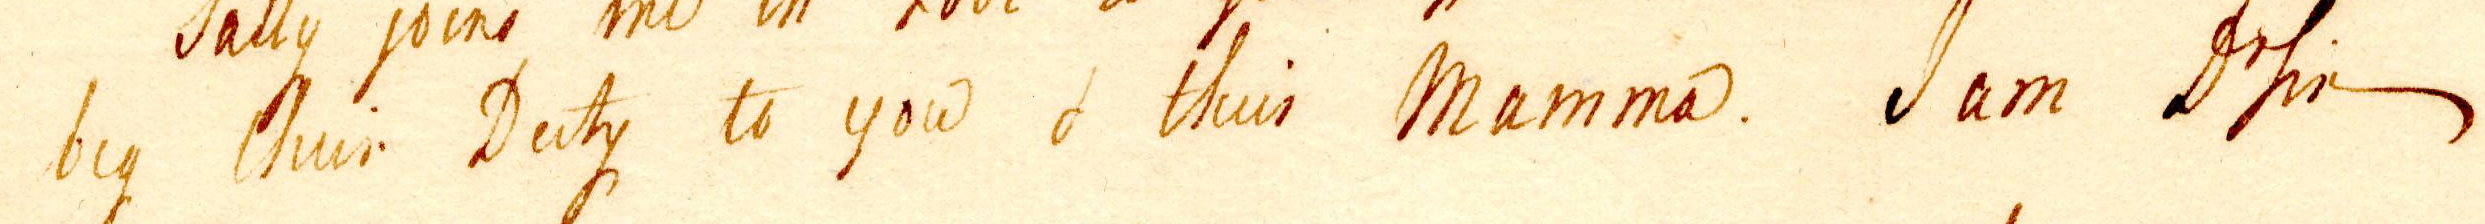by their Duty to you & their Mamma. I am D^r Sir
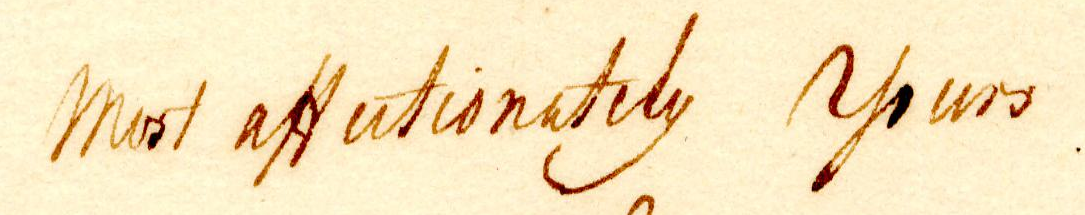Most affectionately Yours
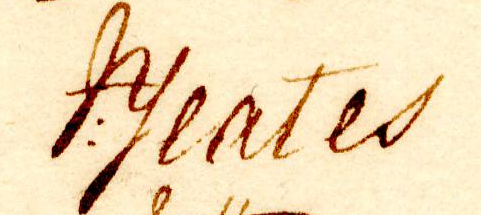J: Yeates
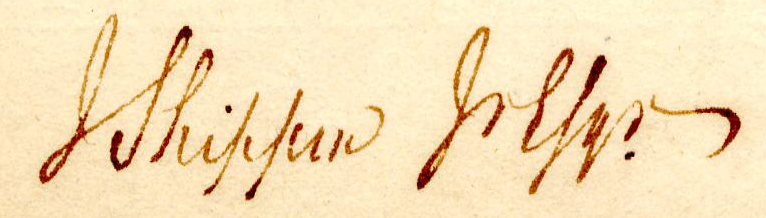J Shippen Jr Esq^r.
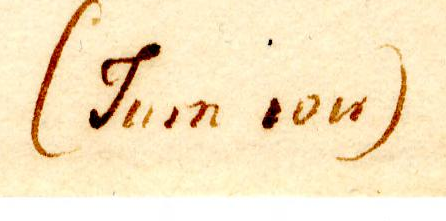(Turn over)
